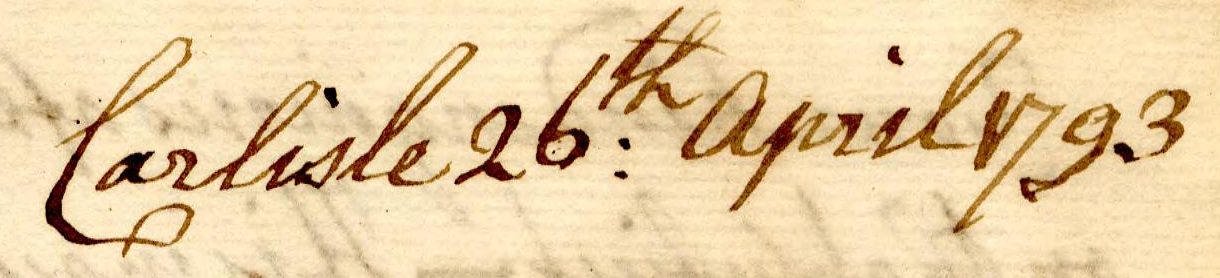Carlisle 26^th: April 1793
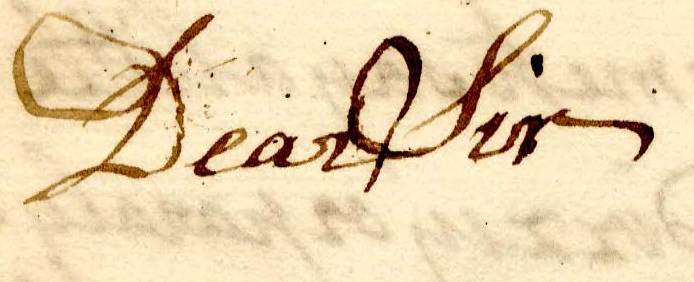Dear Sir
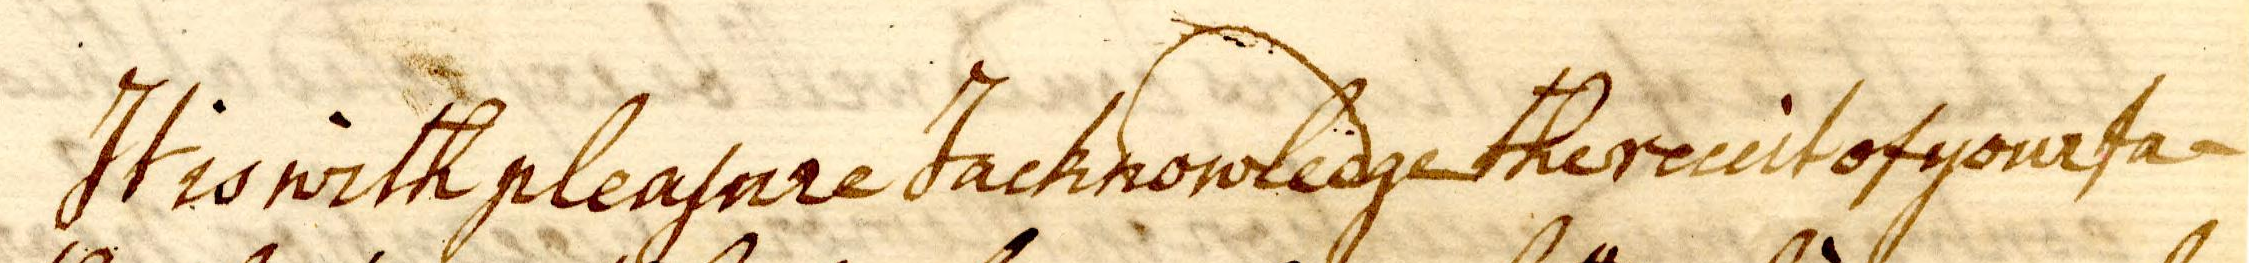It is with pleasure I acknowledge the receit of your fa-
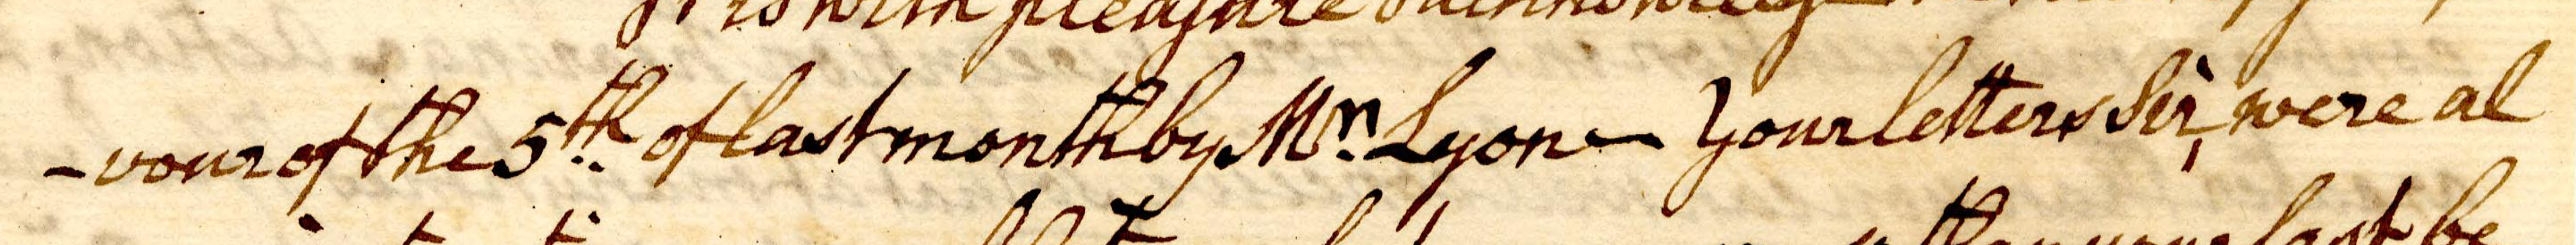-vour of the 5^th. of last month by M^r. Lyon- Your letters Sir, were al
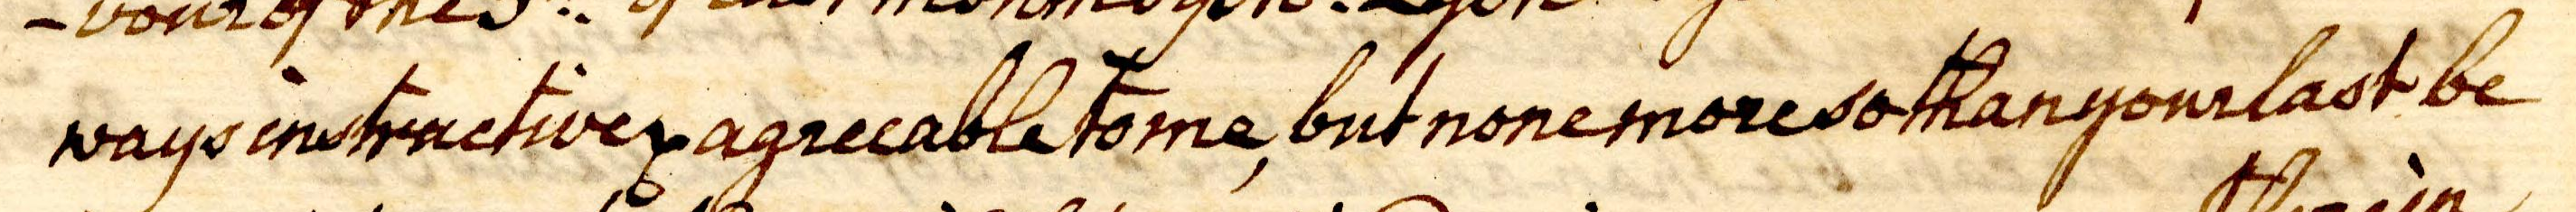ways instructive & agreeable to me, but none more so than your last be
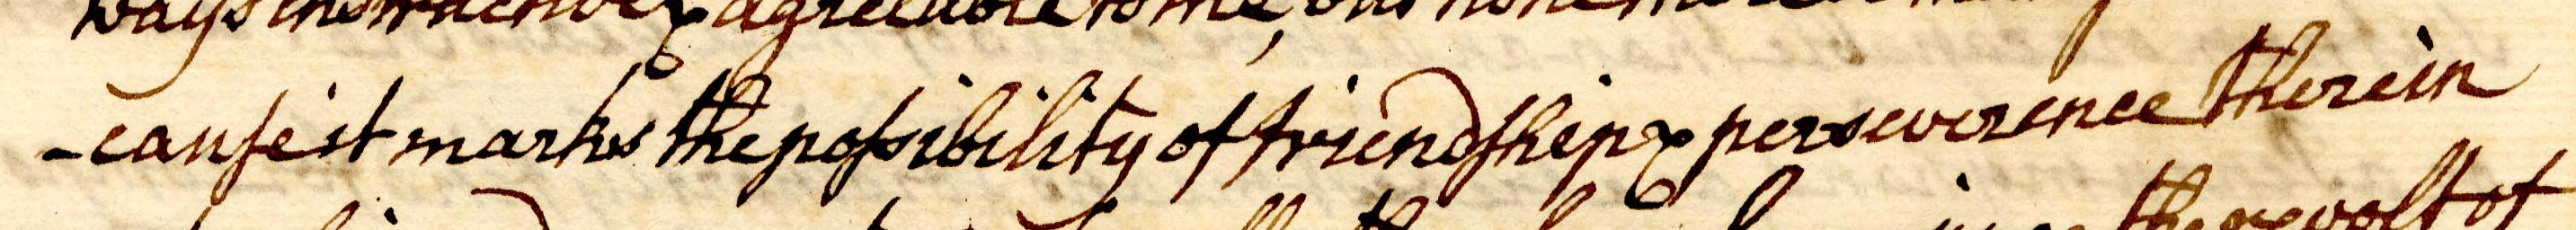-cause it marks the possibility of friendship & perseverence therein
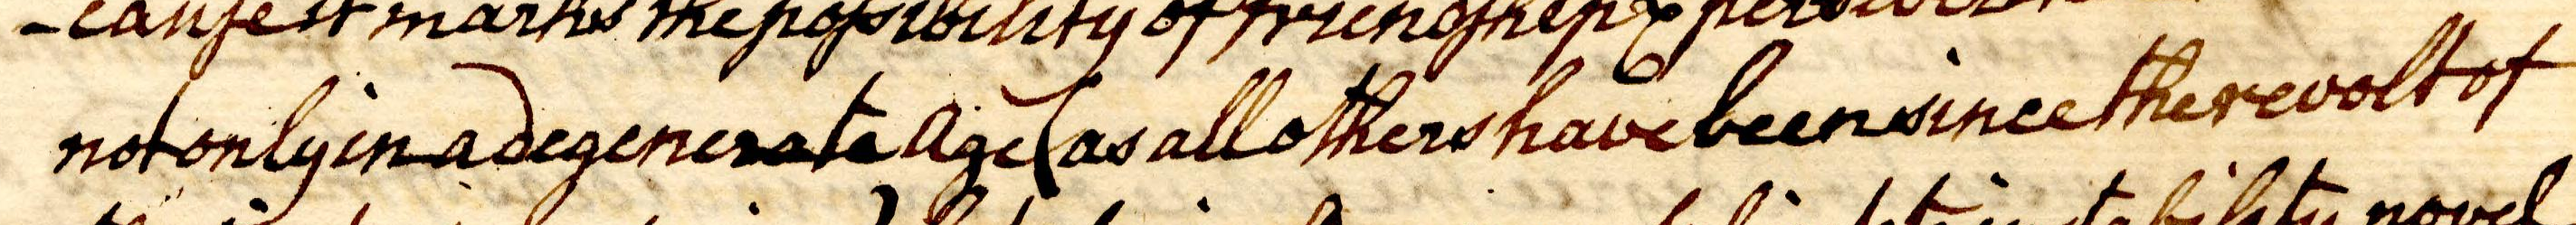not only in a degenerate Age (as all others have been since the revolt of
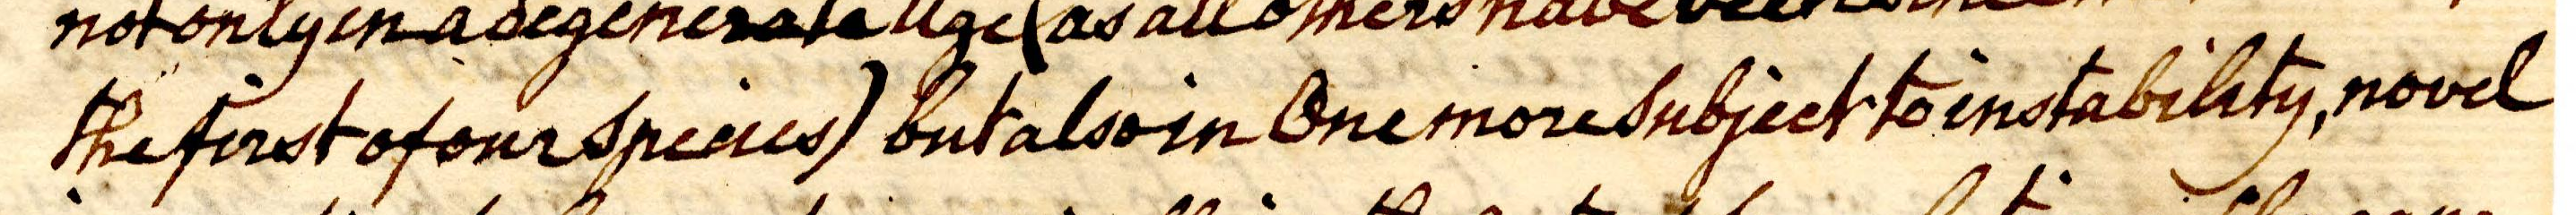the first of our Species) but also in One more subject to instability, novel
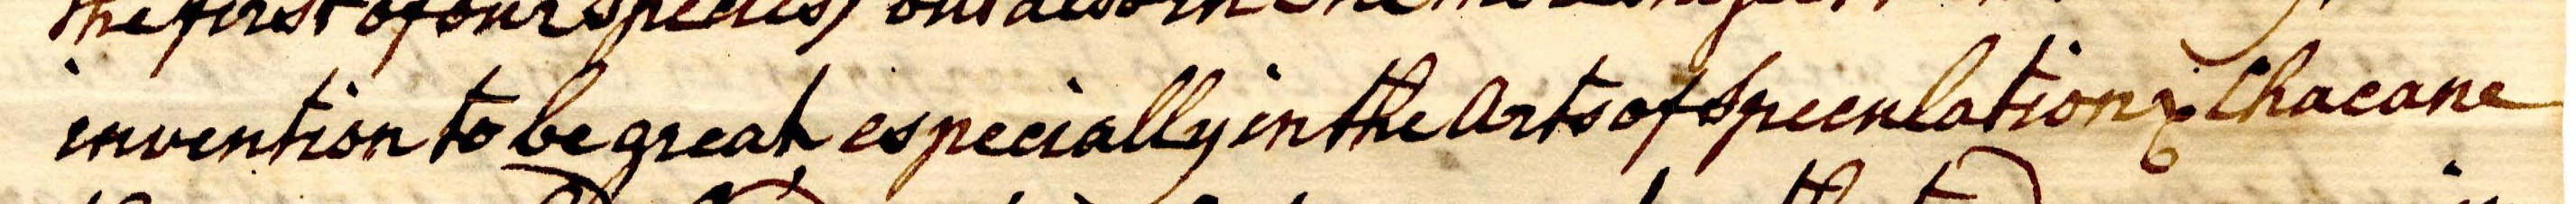invention to be great, especially in the Arts of Speculation & Chacane
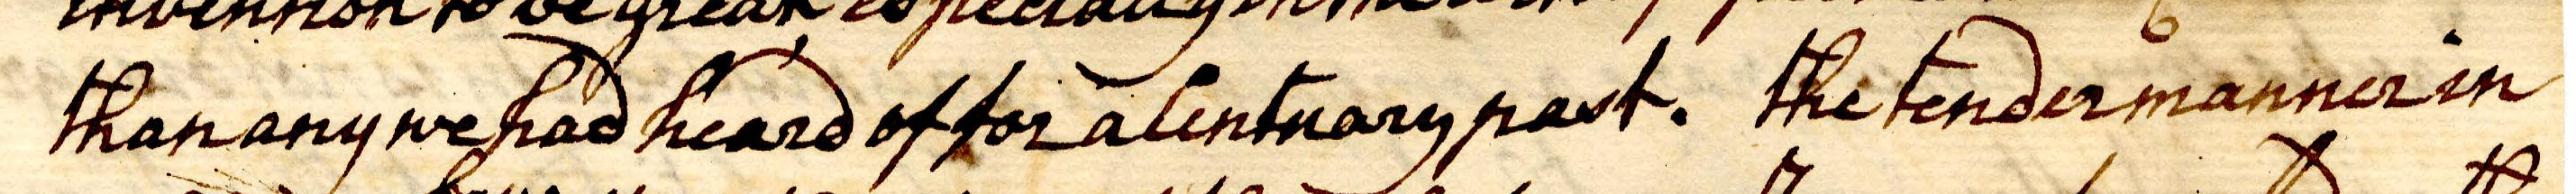than any we had heard of for a Century past. the tender manner in
